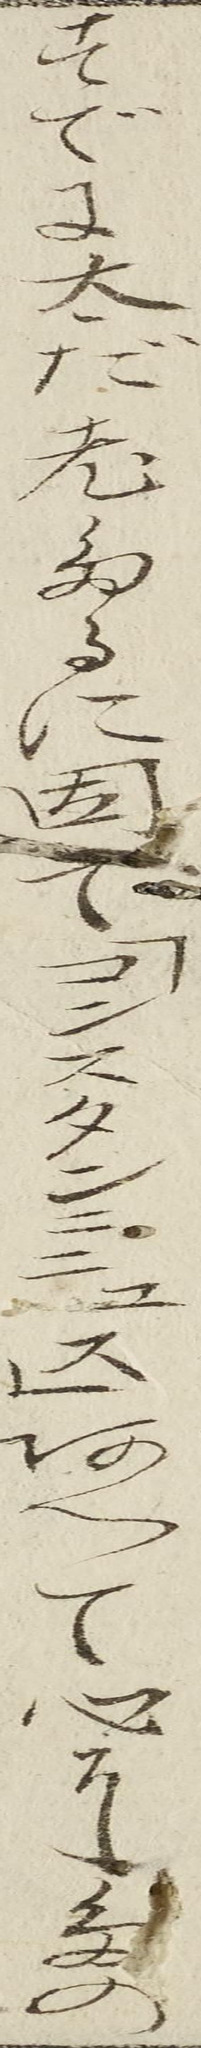すでに太だ老たるに因て「コンスタン二にュス」あへて心にたの
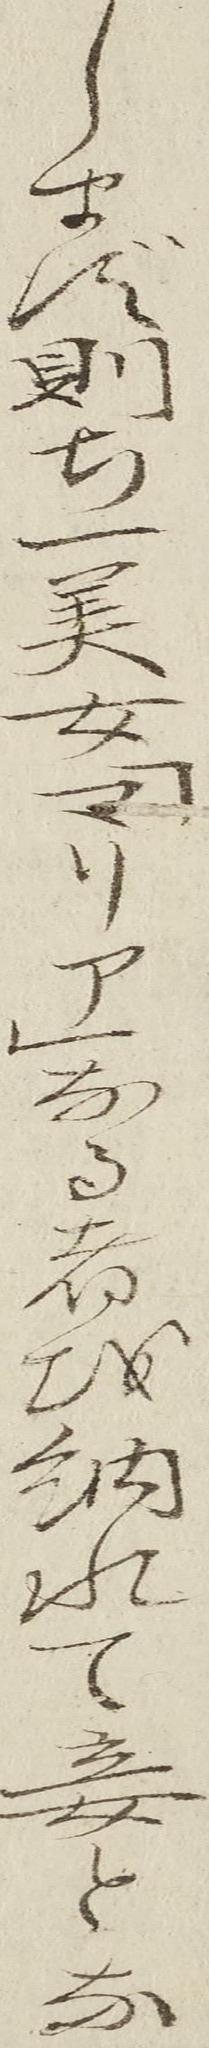しまず則ち一美女「マリア」なる者を納れて妾とな
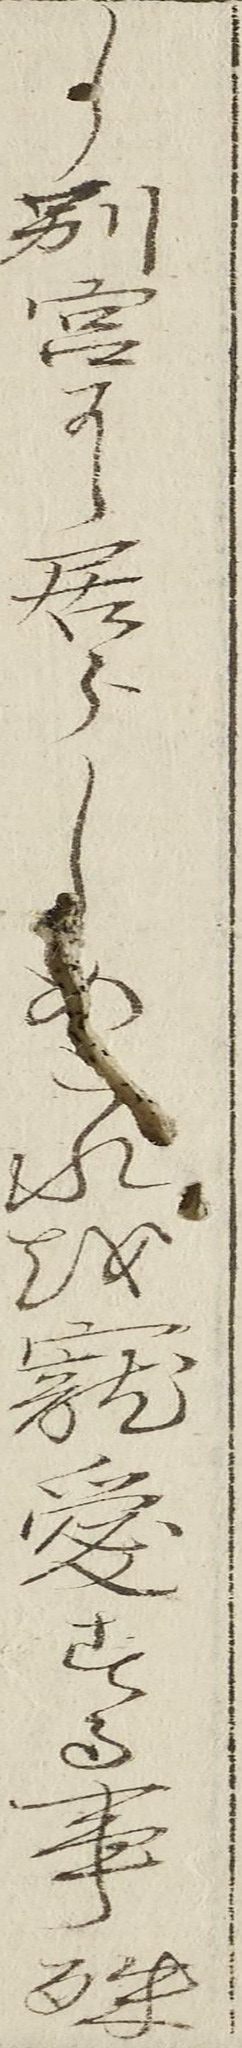し別宮に居らしめこれを寵愛する事特
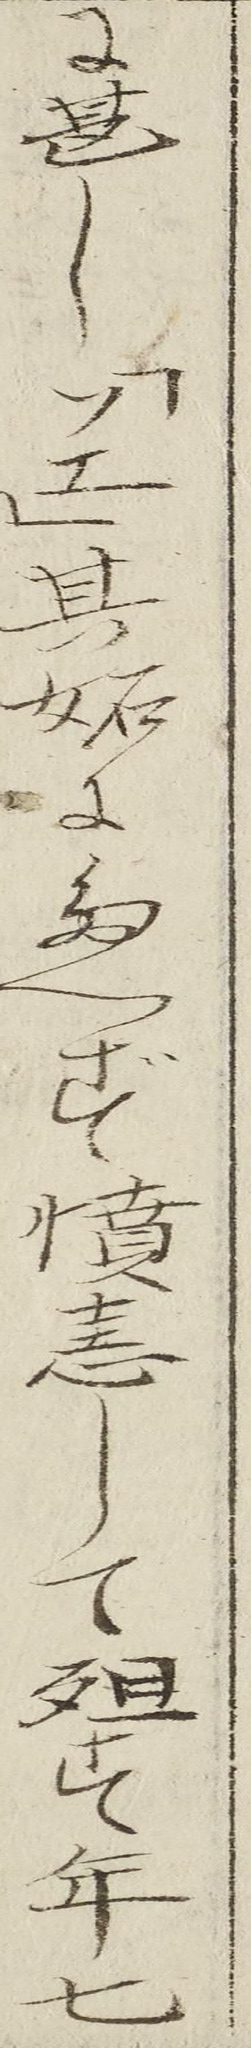に甚し「ソユ」其妬にたへず憤恚して殂す年七
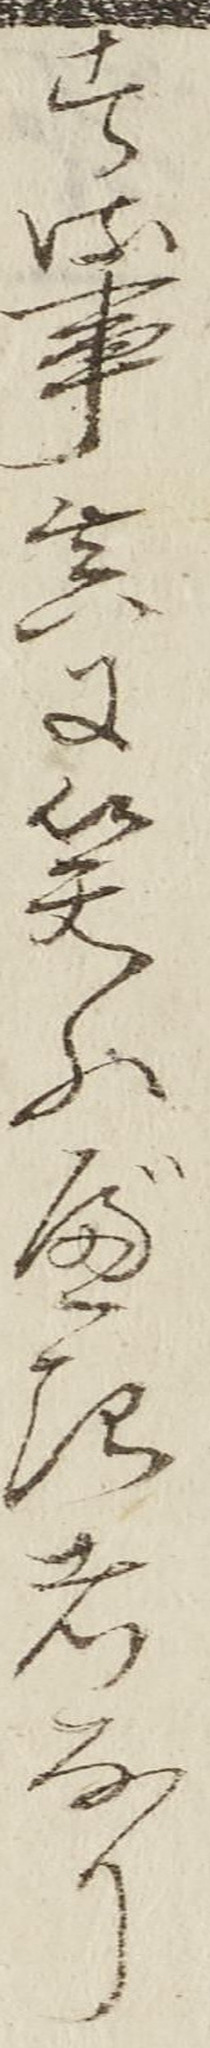する事真に笑ふべき者なり
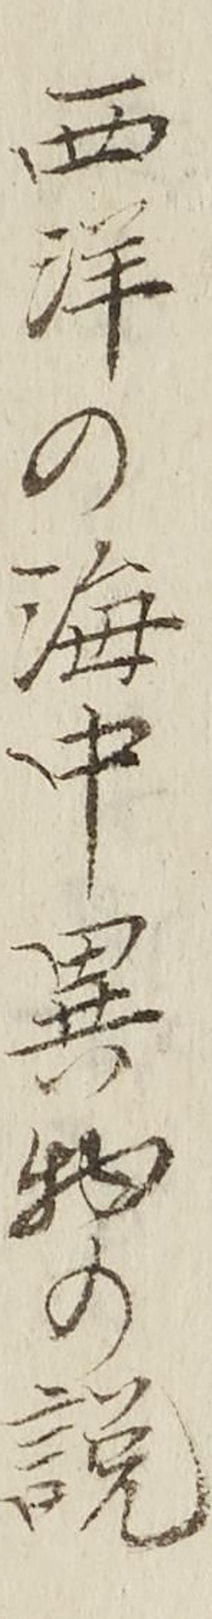西洋の懐中異物の説
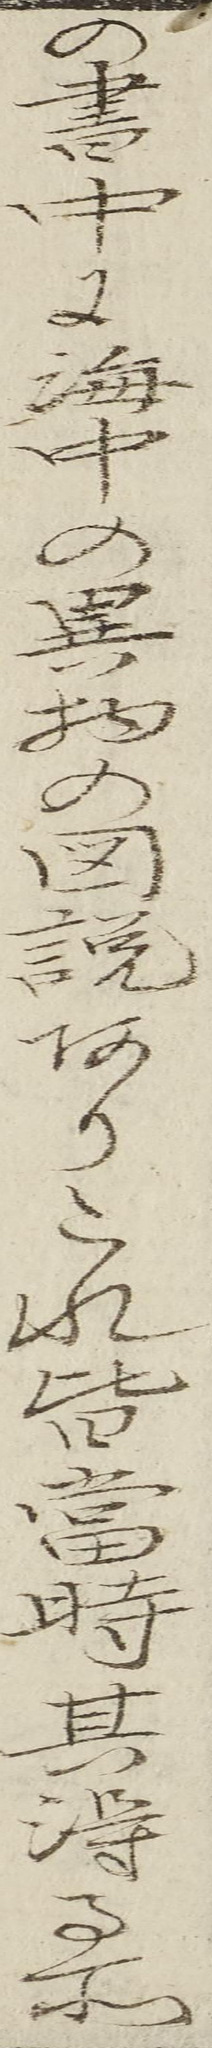の書中に海中の異物の図説ありこれ皆当時其得る所
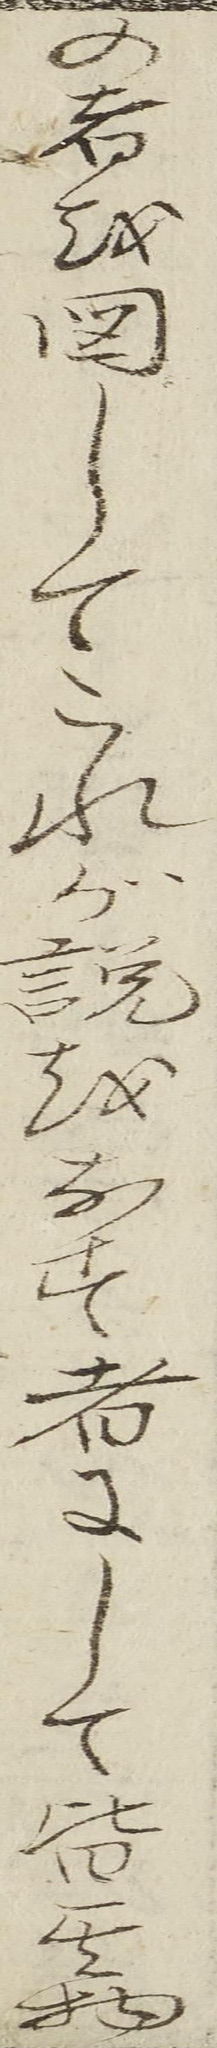の者を図してこれが説をなす者にして皆其物

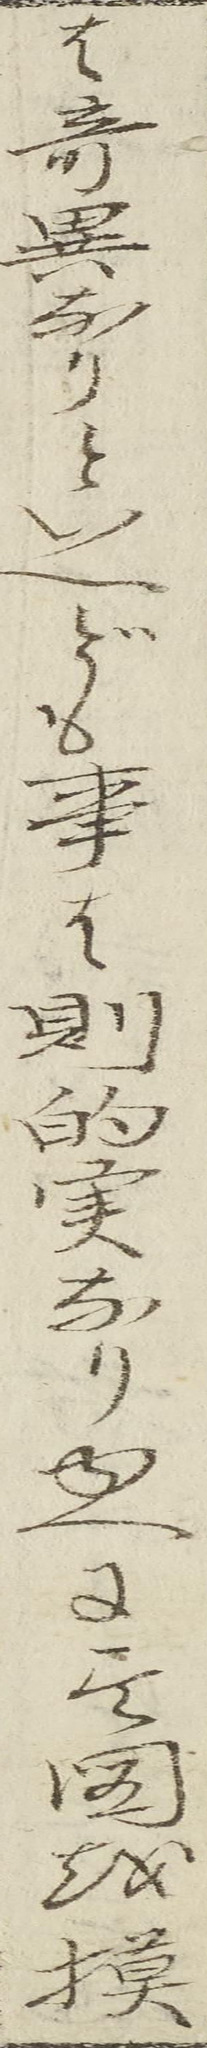は奇異なりといへども事は則的実なりゆへに其国を摸
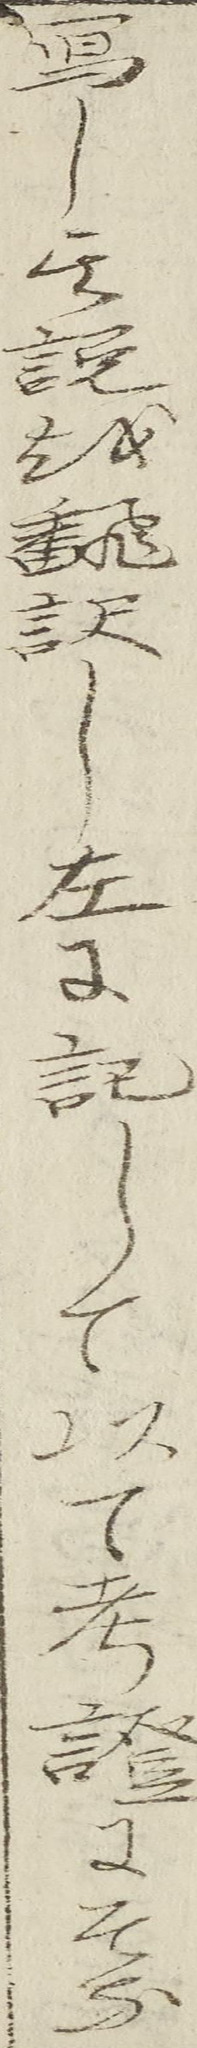写しそ説を翻訳し左に記して以て考証にそふ
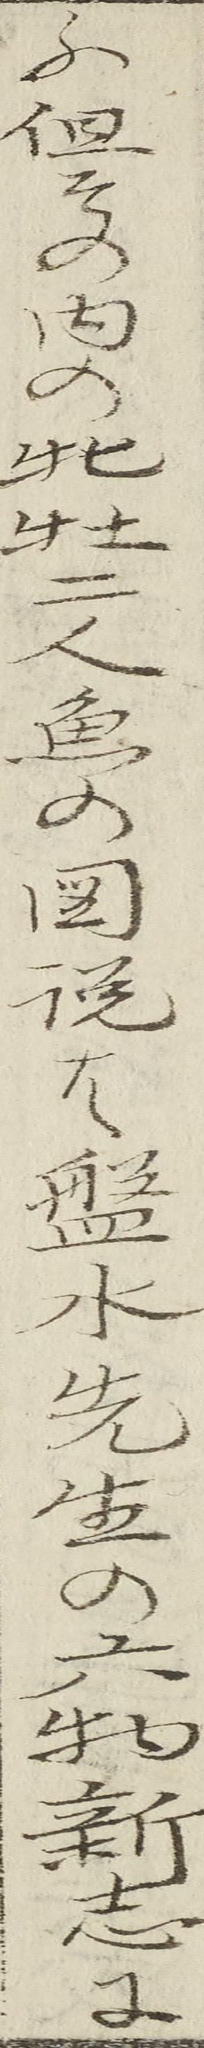もの但その内の牝牡二人魚の図説は盤水先生の六物新志に
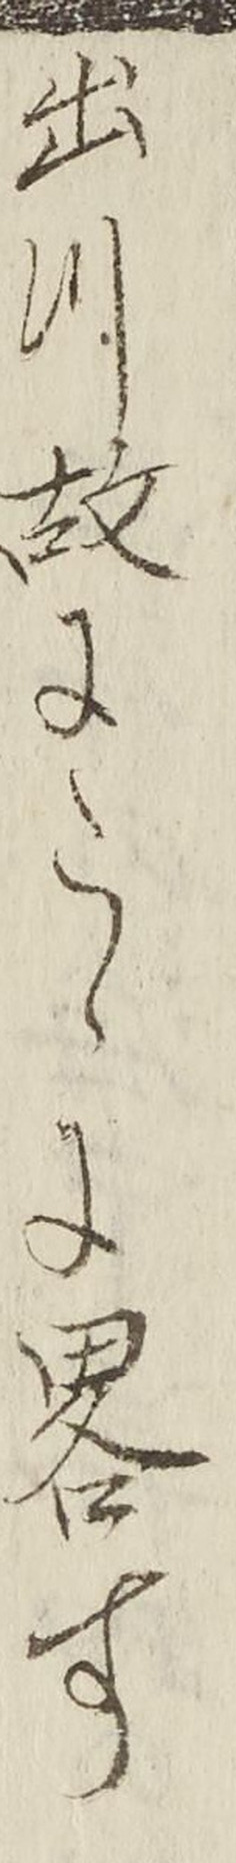出つ故にこゝに畧す
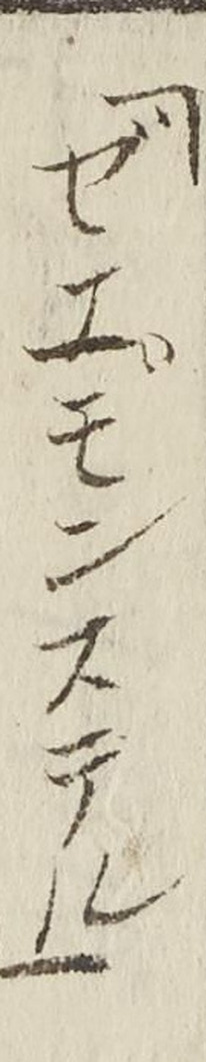「ゼエ。モンステル」
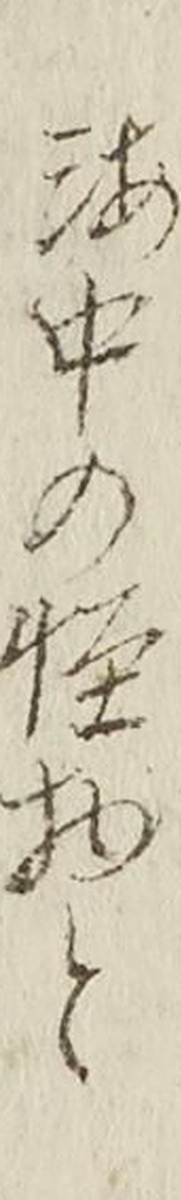海中の怪物と
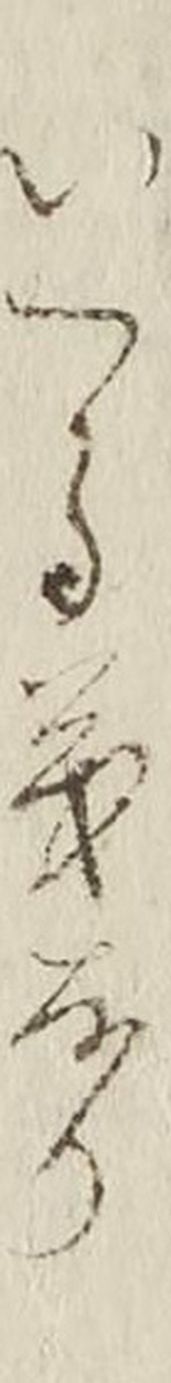いへる義なり
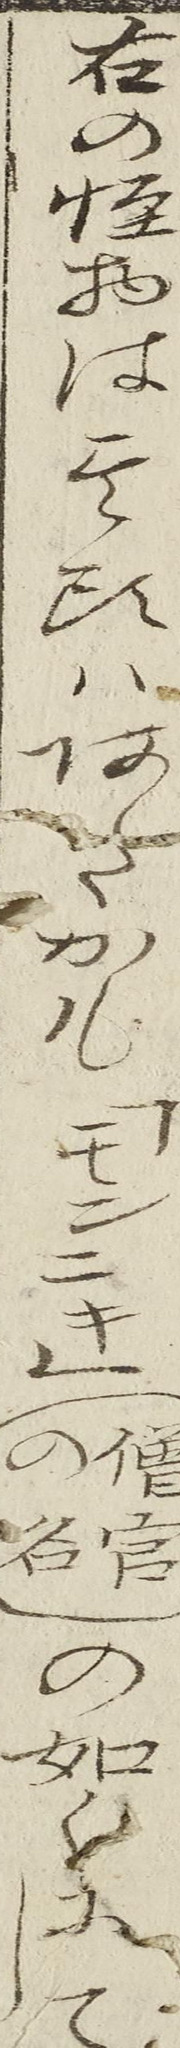右の怪物は其頃ハあたかも「モンニキ」の如くにて
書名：西洋雜記　乾
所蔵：東京大学地震研究所図書室 Earthquake Research Institute Library, The University of Tokyo, JAPAN
